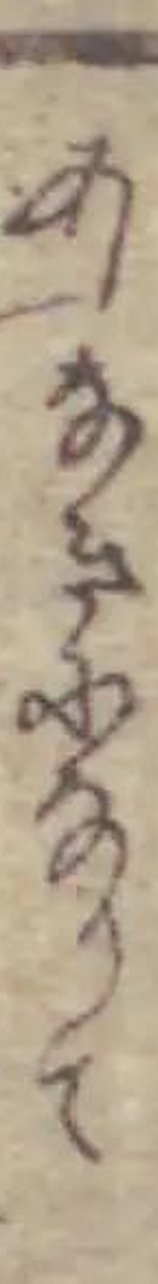あしなきになりて
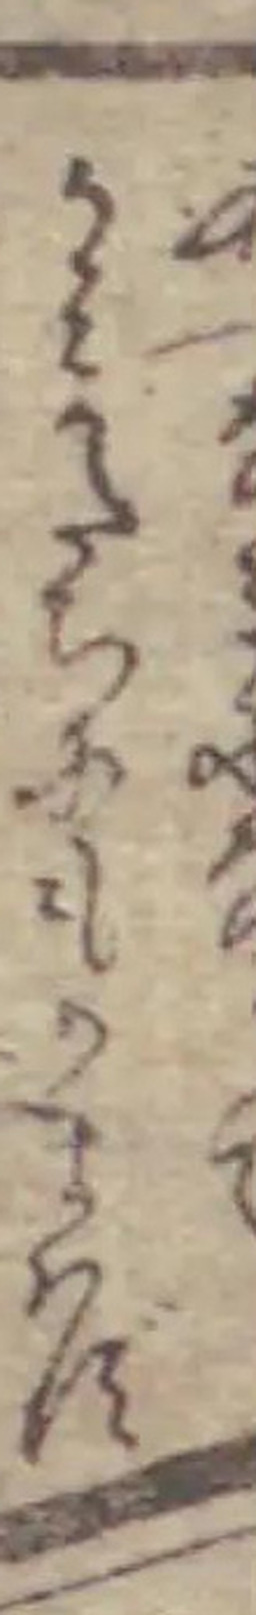かみかたちにもかまはず
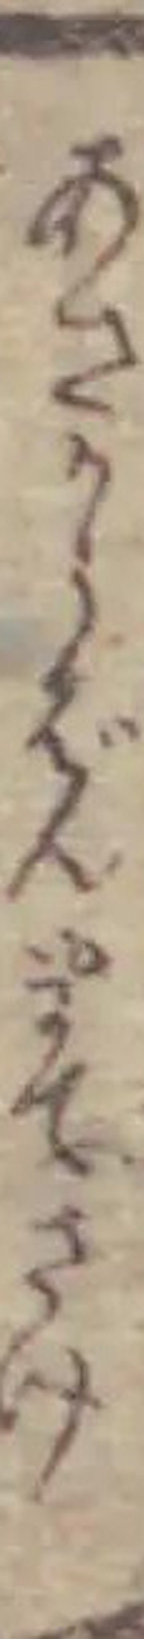あさからばんまてさけ
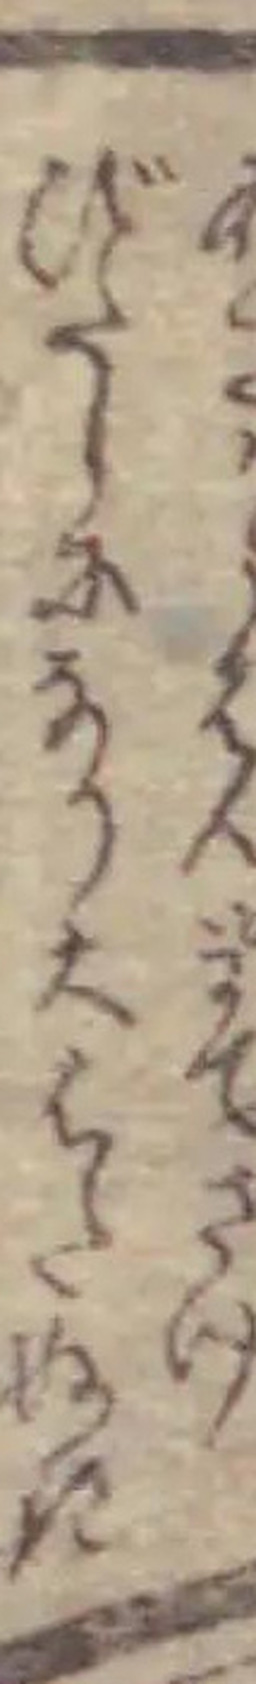びたしになり大はたぬき
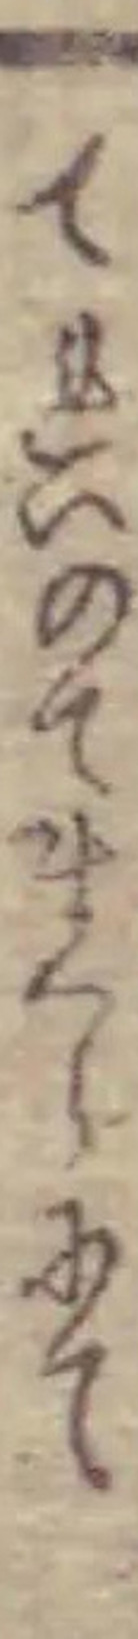てれいのてまくらにて
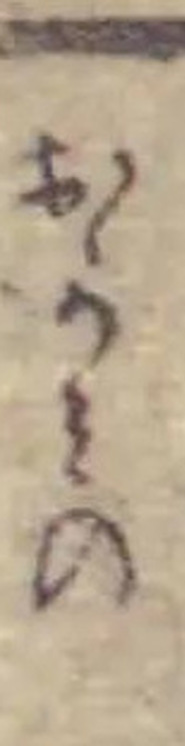おゝかみの
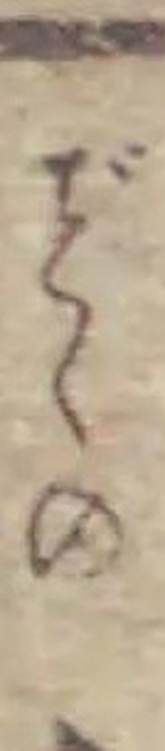ごとくの
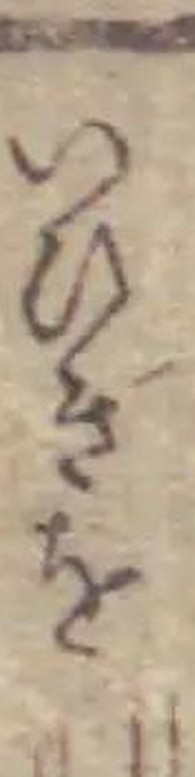いひきを
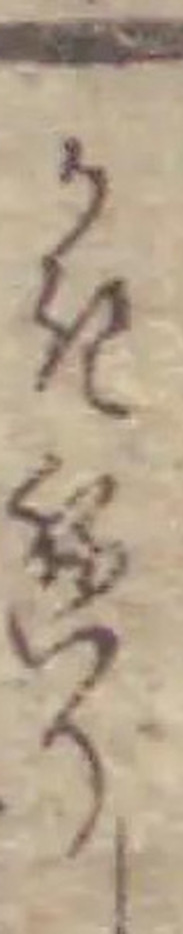かきねいり

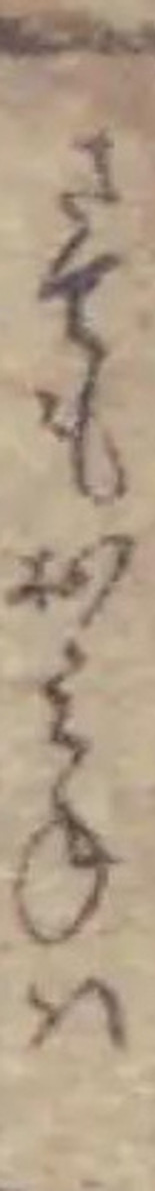さてもおみねは
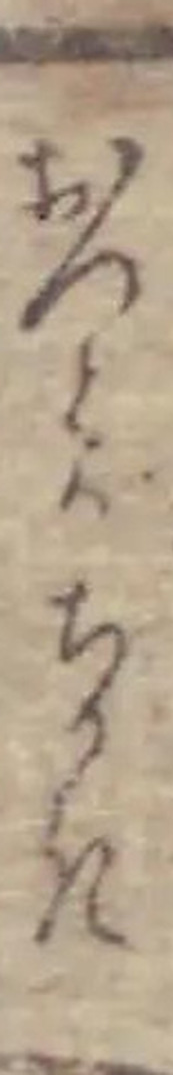おつとがちかき
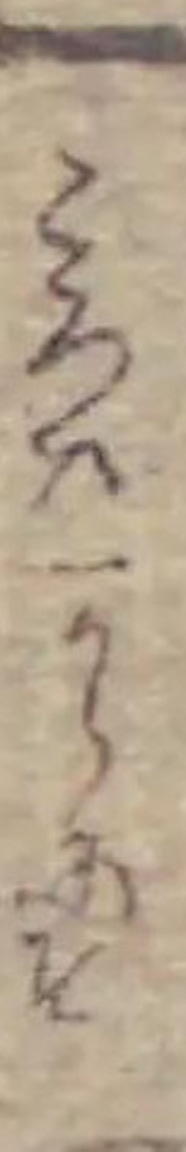ころは一かうにそ
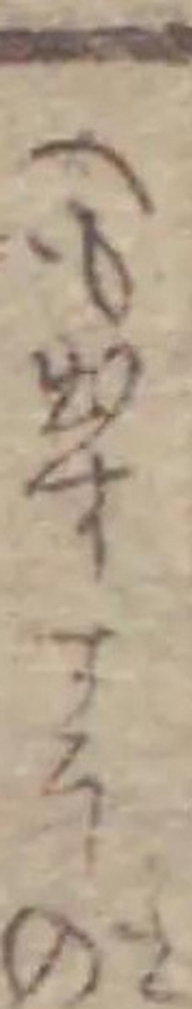へも出すすこしの
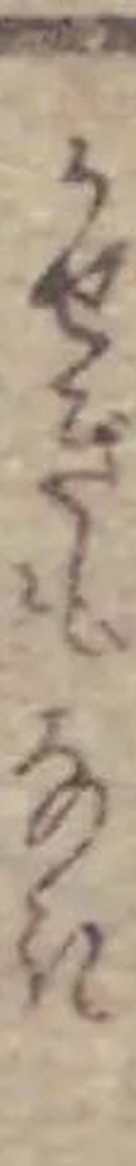かせぎもなき
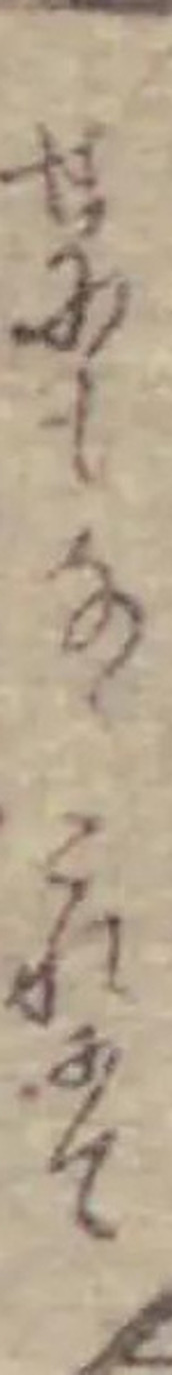せにもなくこれにて
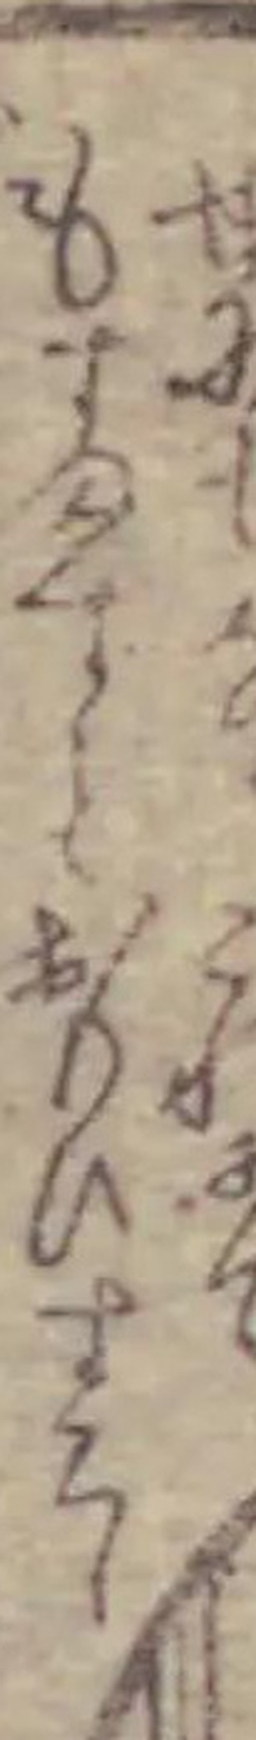もすますとおもひすこし
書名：飛た間違矢口噂 2巻
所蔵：国立国会図書館 National Diet Library, JAPAN
